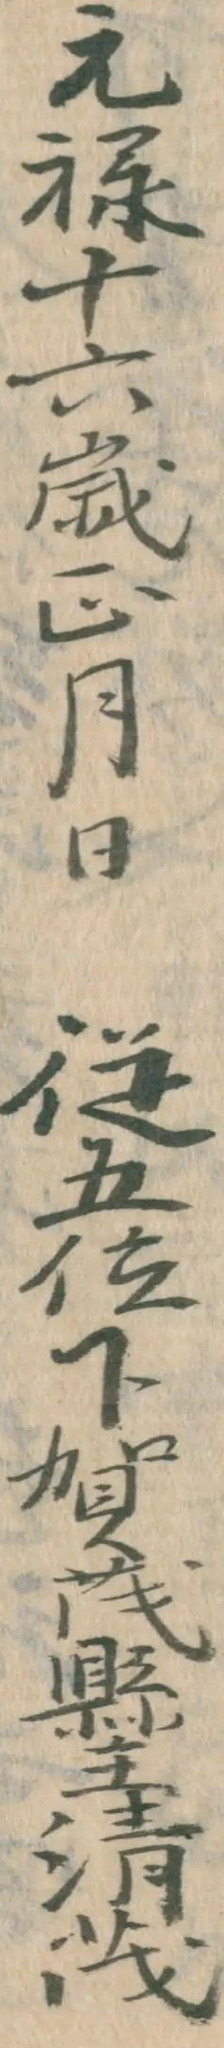元禄十六歳正月日従五位下賀茂県王清茂
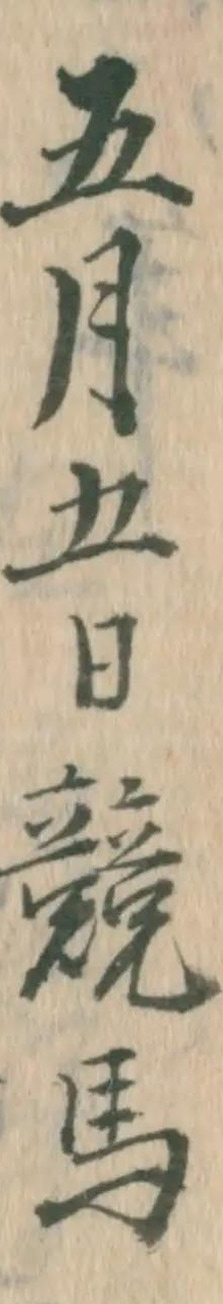五月五日競馬
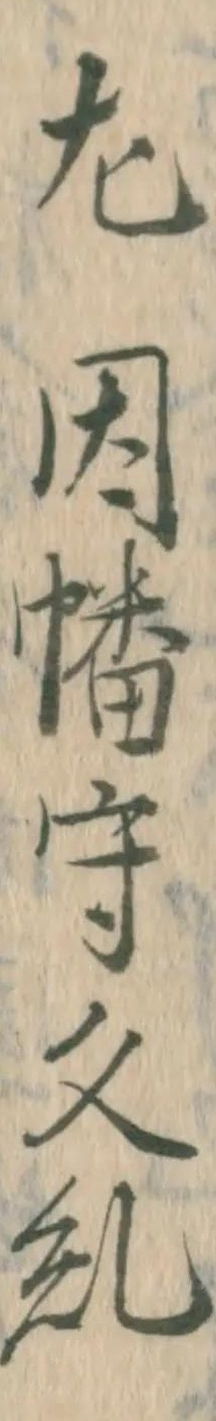左因幡守久糺
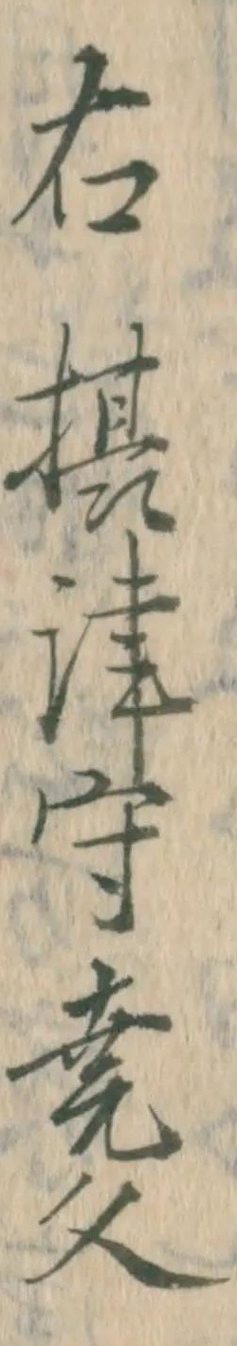右摂津守尭久
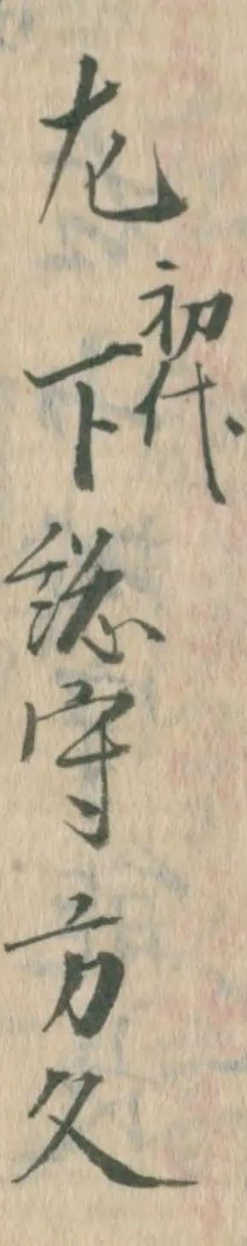左下総守方父
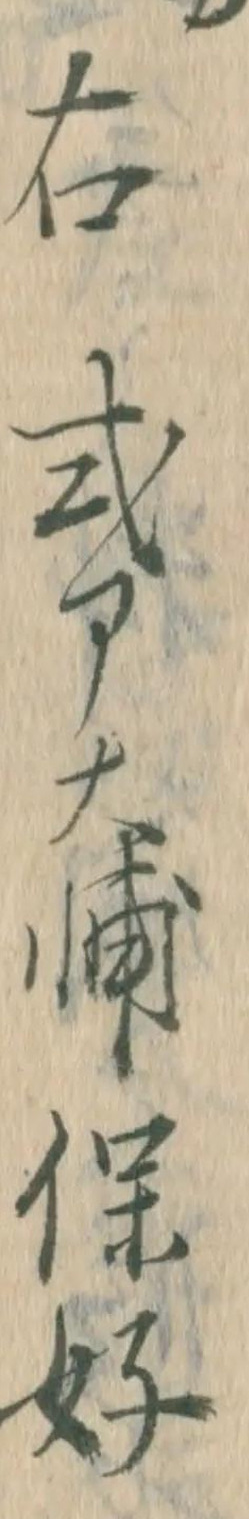右式部大輔保好
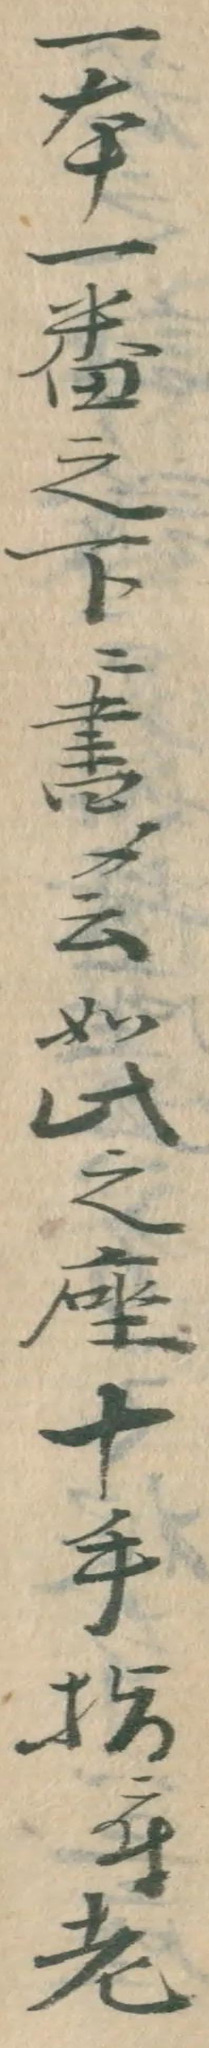一本一番之下ニ書〆云如此之座十手指ニ付老

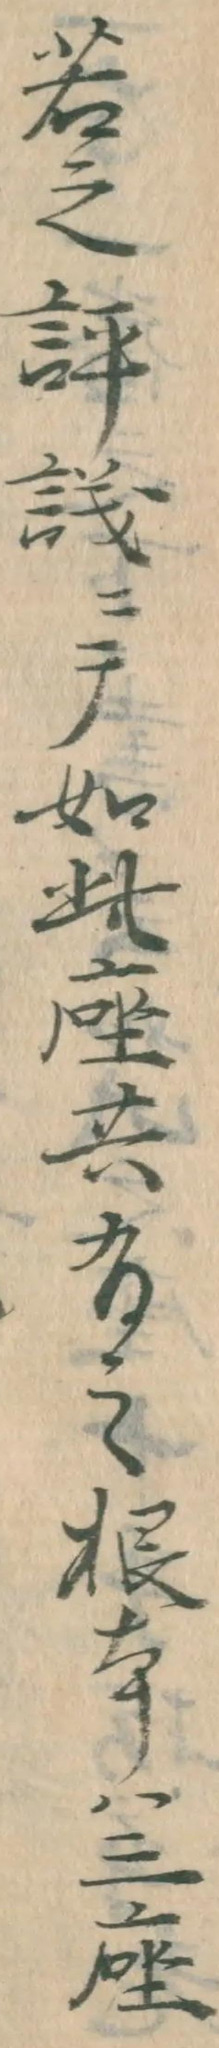若之評議ニテ如此座共有之根本ハ三座
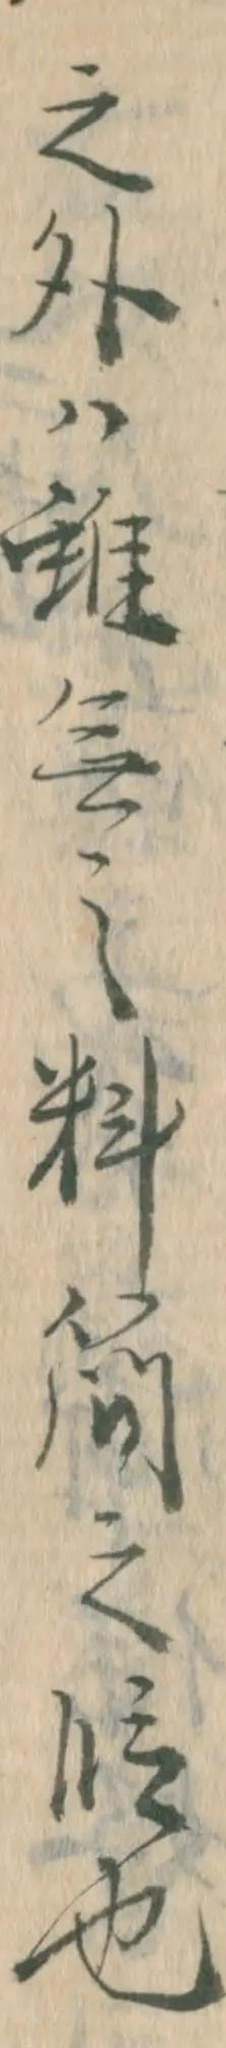之外ハ雖無之料簡之段也
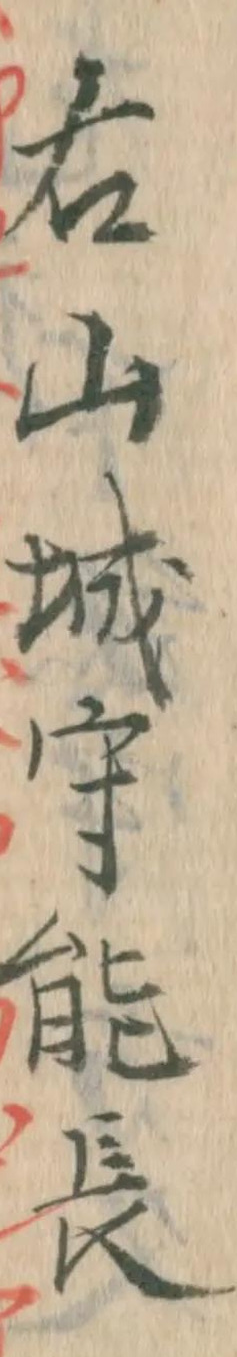右山城守能長
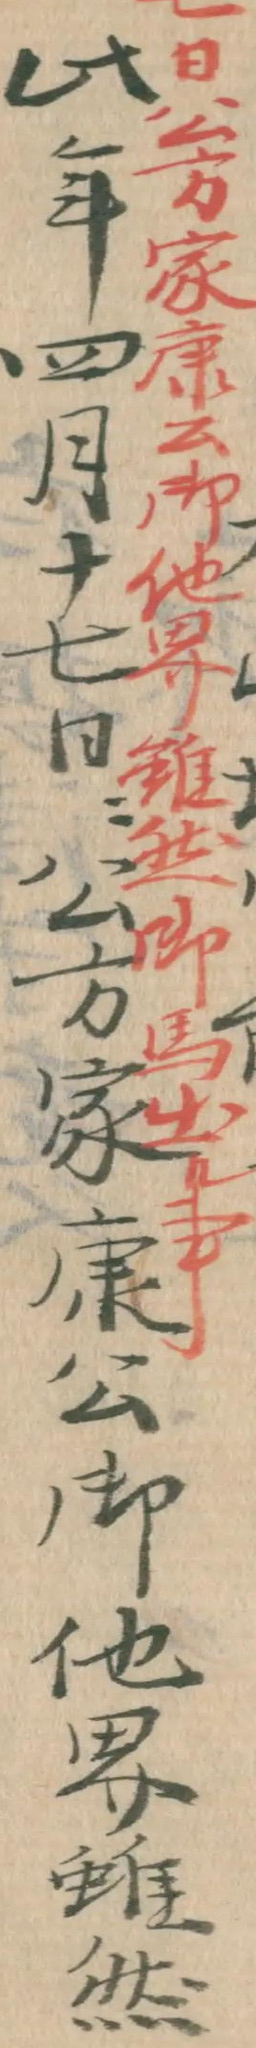此年四月十七日ニ公方家康公御他界雖然
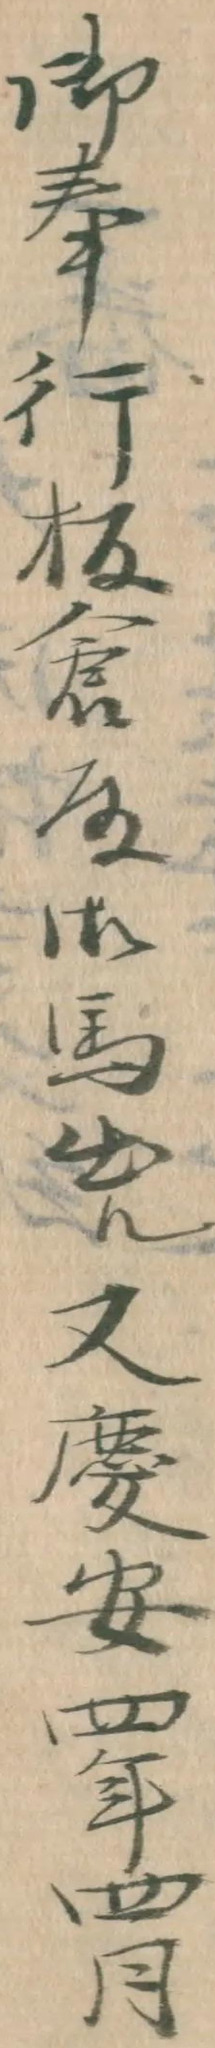御奉行板倉殿御馬出ル又慶安四年四月
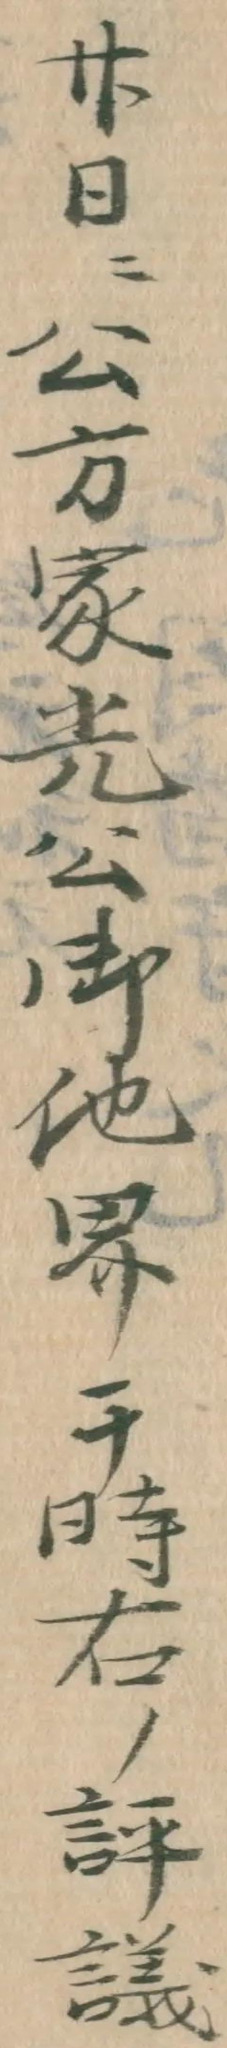廿日ニ公方家光公御他界于時右ノ評議
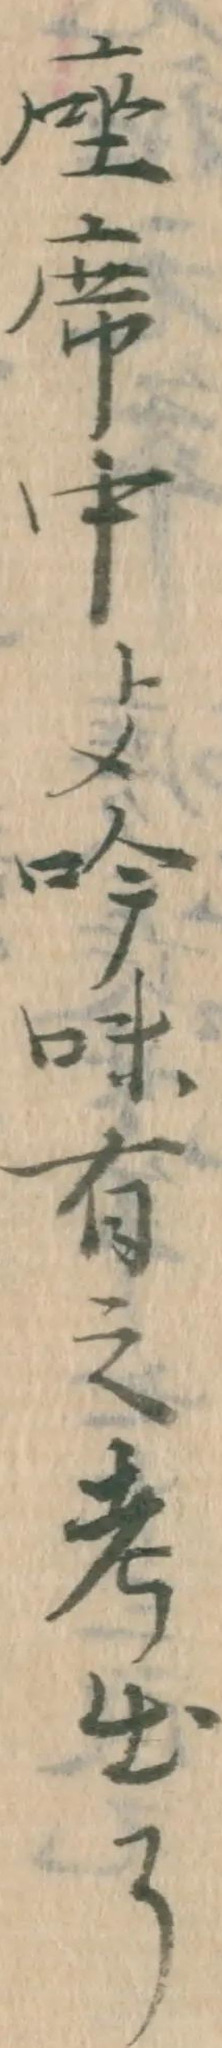座席中トシテ吟味有之考出了
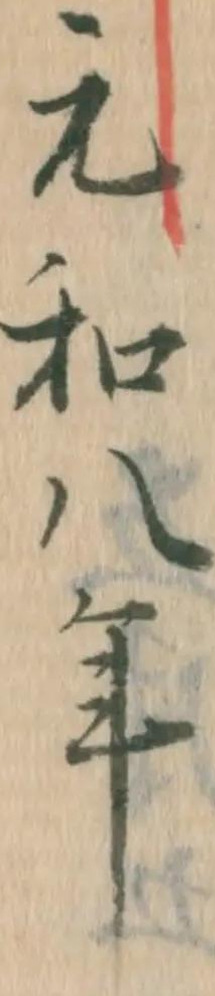元和八年
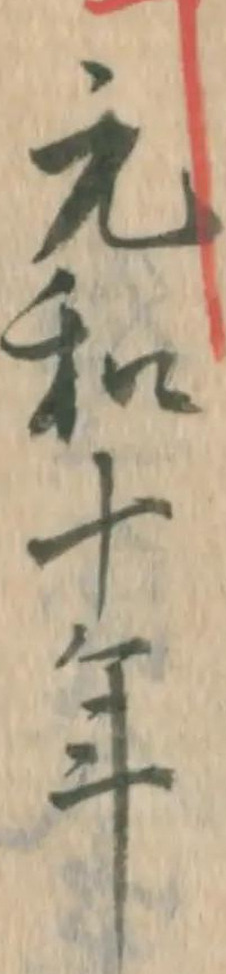元和十年
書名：賀茂社記録. 第10冊
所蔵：国立国会図書館 National Diet Library, JAPAN
